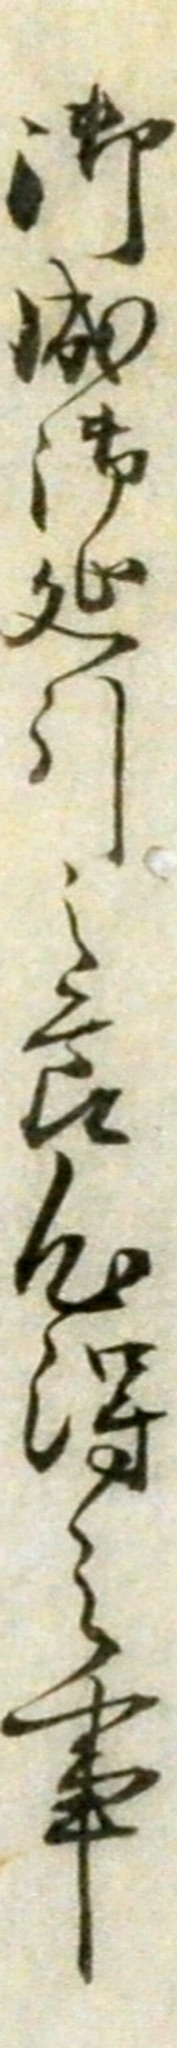御成御延引之節心得之事
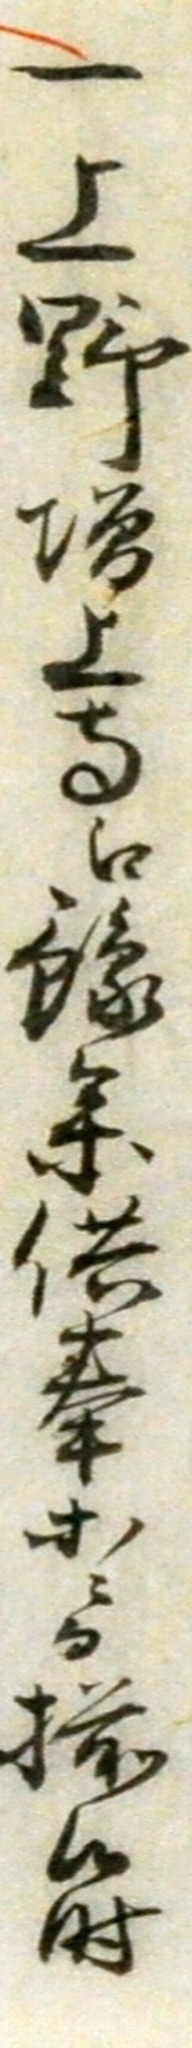一上野増上寺え予参供奉等にて揃候時
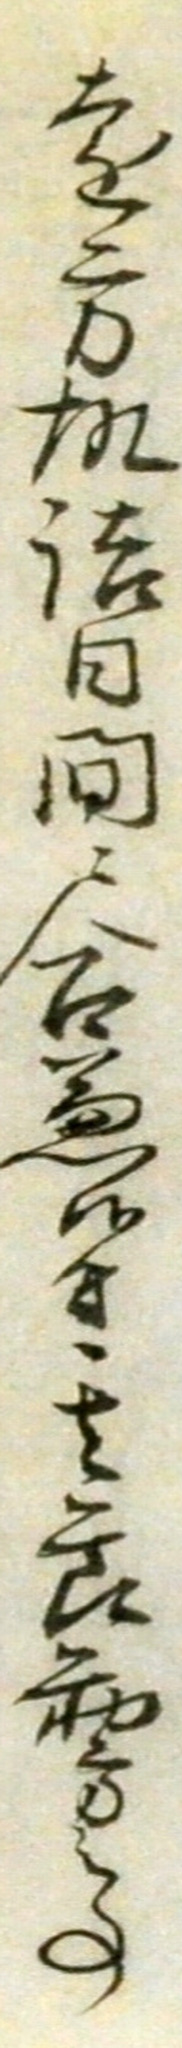遠方故詰日間に合兼候付其節勤方之事
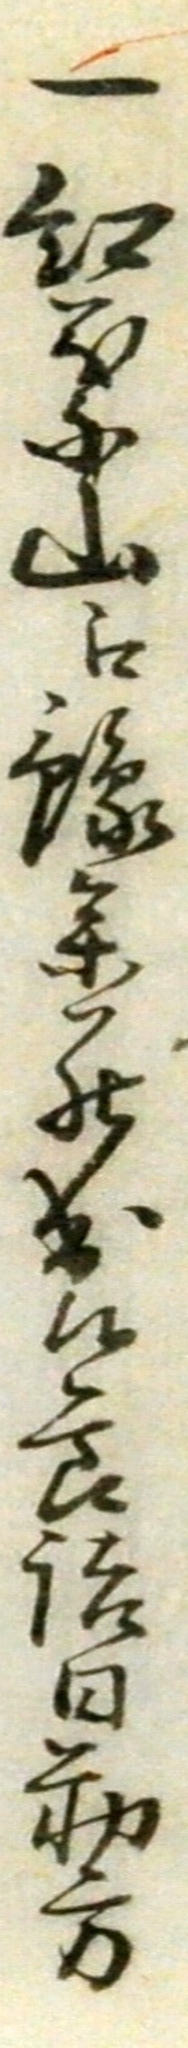一紅葉山え予参罷出候節詰日勤方

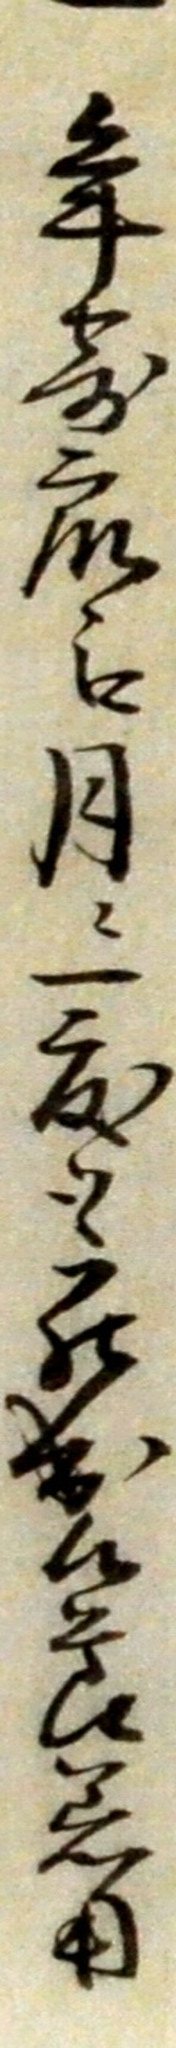一年寄衆え月に一度ツヽ罷出候節着用
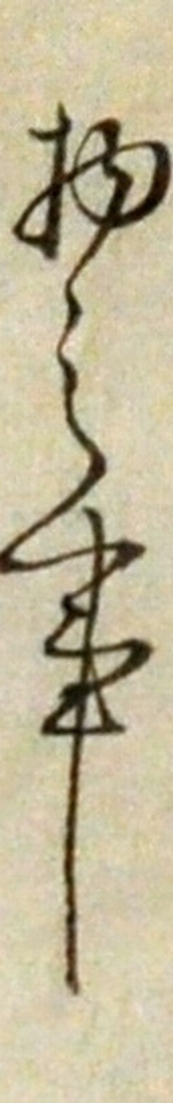物之事
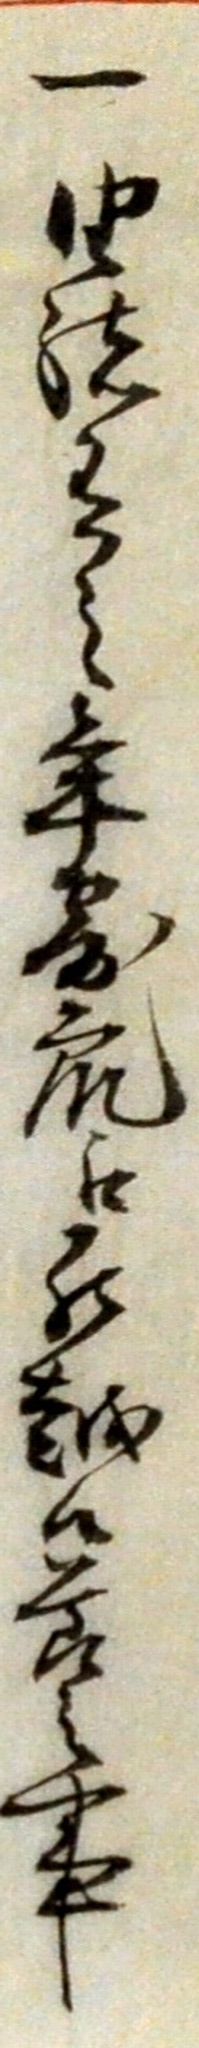一由緒有之年寄衆え罷越候節之事
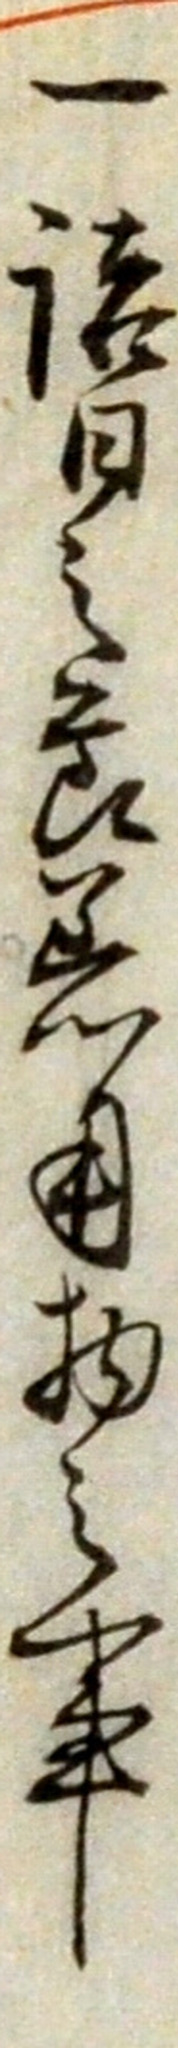一詰日之節着用物之事
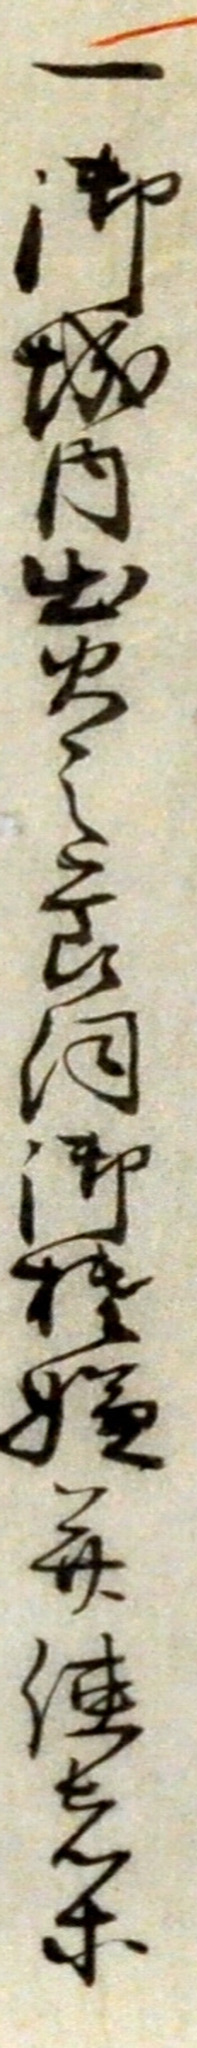一御城内出火之節伺御機嫌并使者等
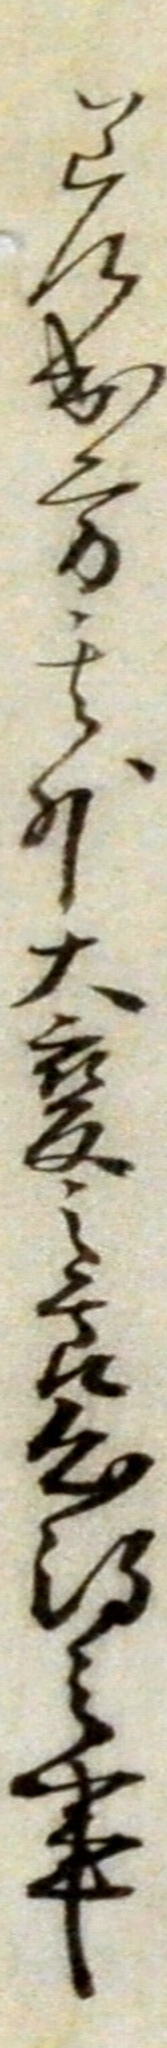差出方其外大変之節心得之事
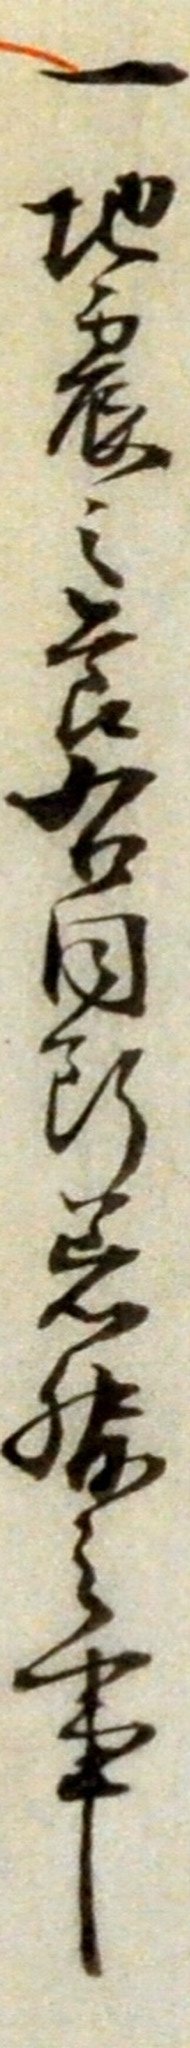一地震之節右同断着服之事
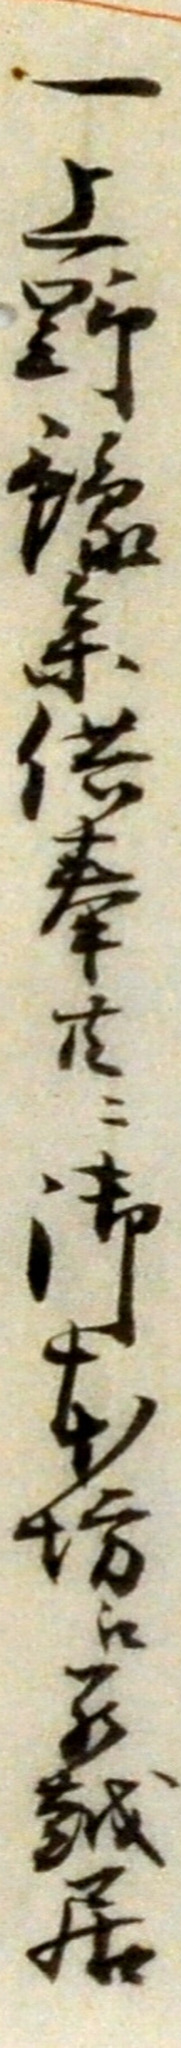一上野予参供奉共に御本坊え罷越居
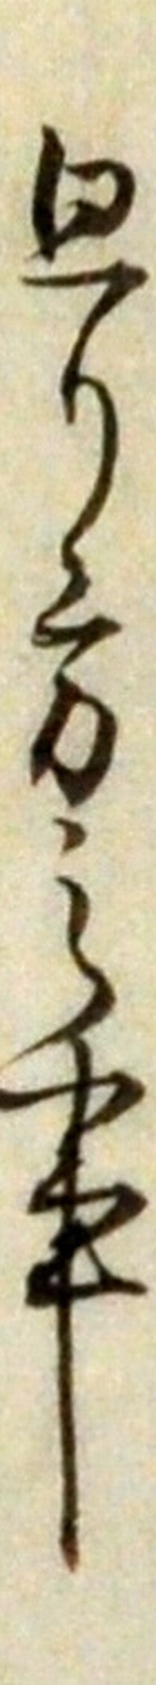廻り方之事
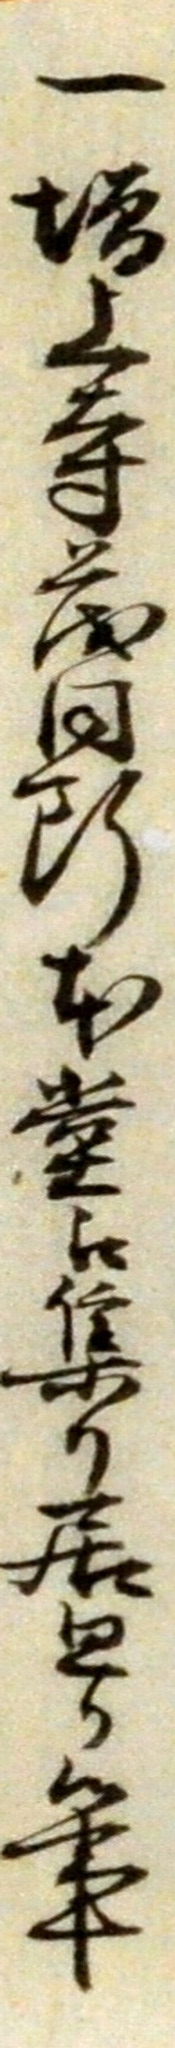一増上寺も同断本堂え集り居廻り候事
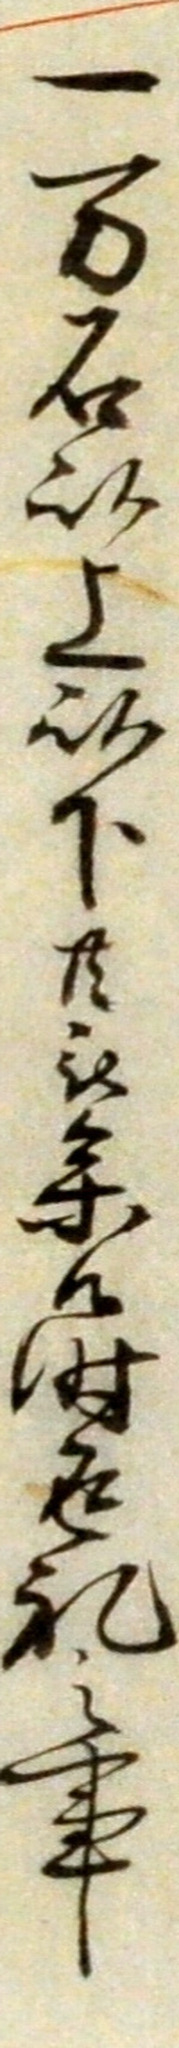一万石以上以下共被参候時返礼之事
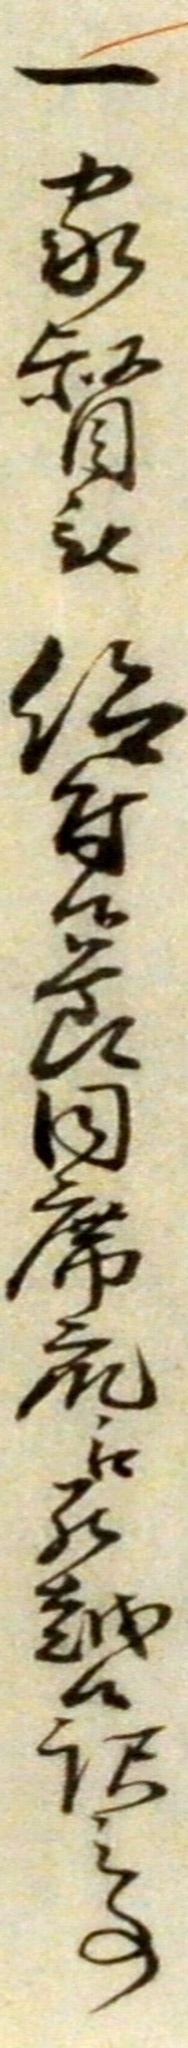一家督被仰付候節同席衆え罷越候訳之事
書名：申合帳〔一括〕
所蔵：伊那市立高遠町図書館・合同会社AMANE
